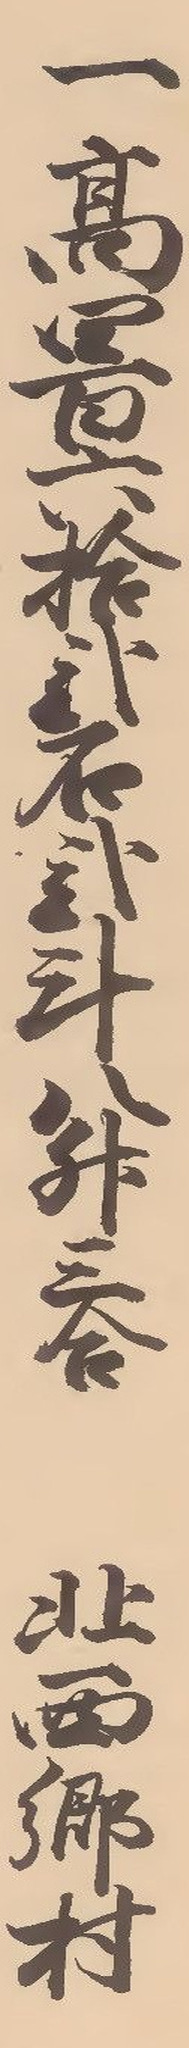一高四百六拾弐石弐斗八升三合北西郷村
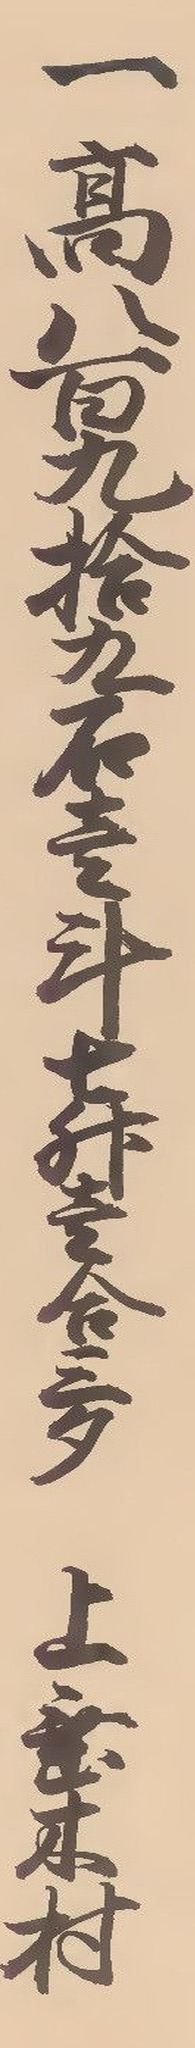一高八百九拾九石壱斗七升壱合三勺上垂木村
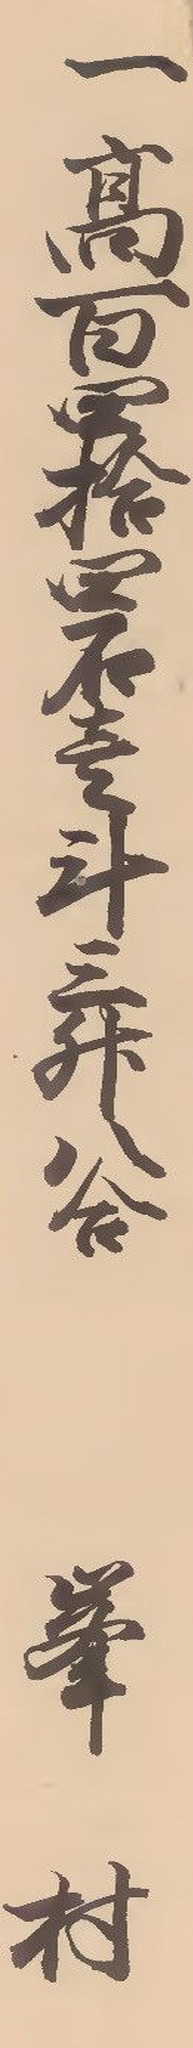一高百四拾四石壱斗三升八合峯村
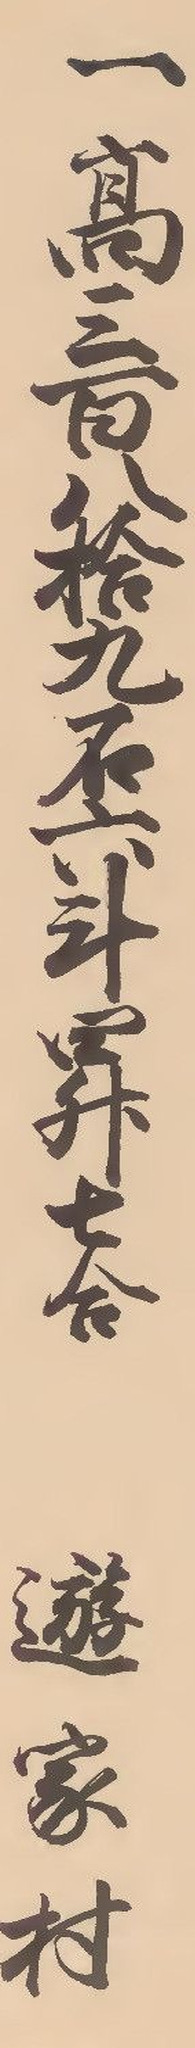一高三百八拾九石六斗四升七合遊家村
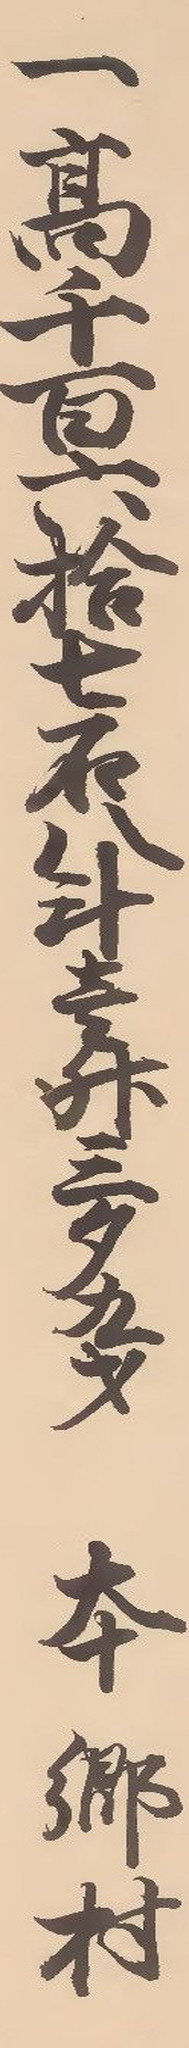一高千百六拾七石八斗壱升三勺九才本郷村
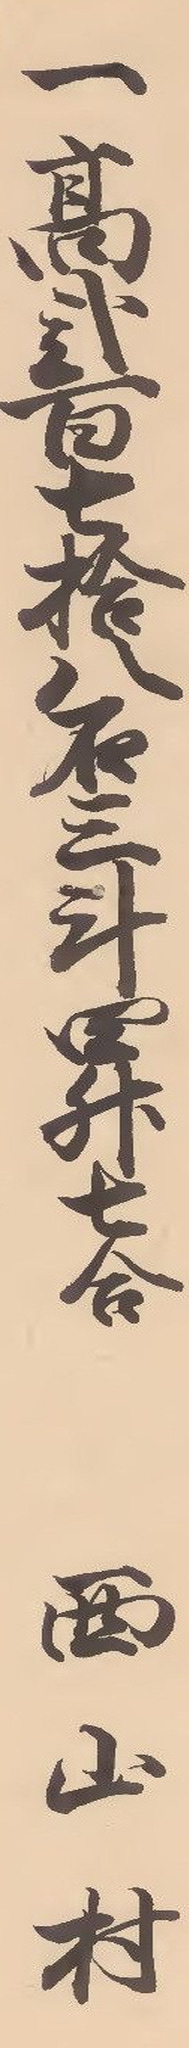一高弐百七拾八石三斗四升七合西山村
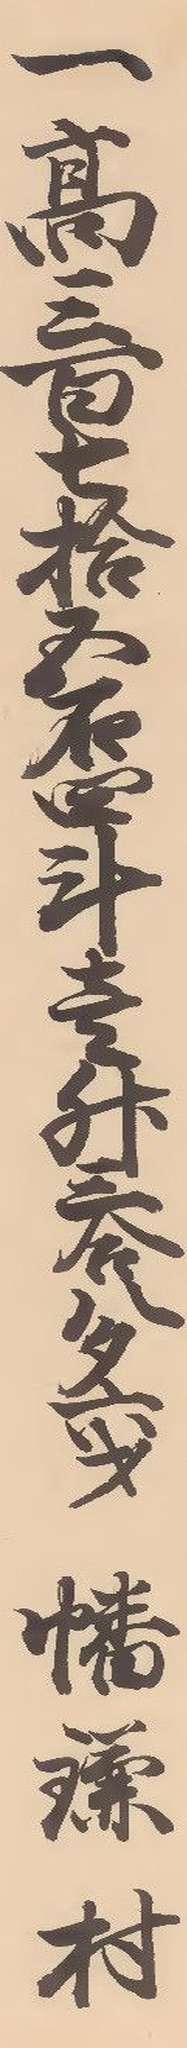一高三百七拾五石四斗壱升三合八勺六才幡鎌村
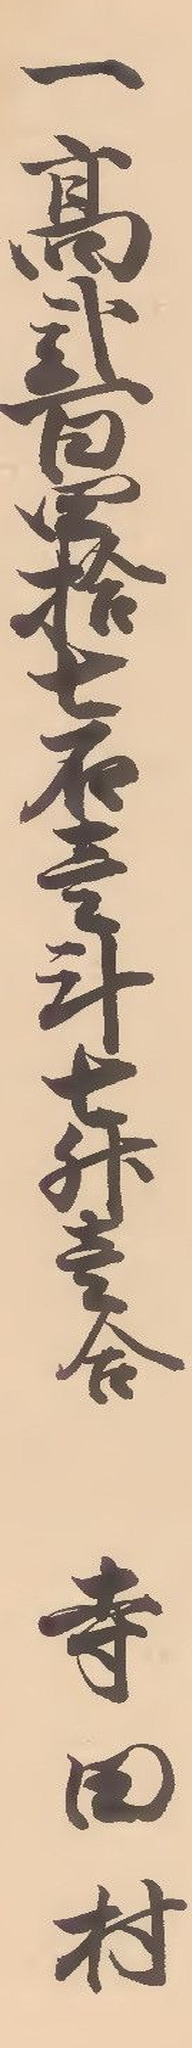一高弐百四拾七石壱斗七升壱合寺田村

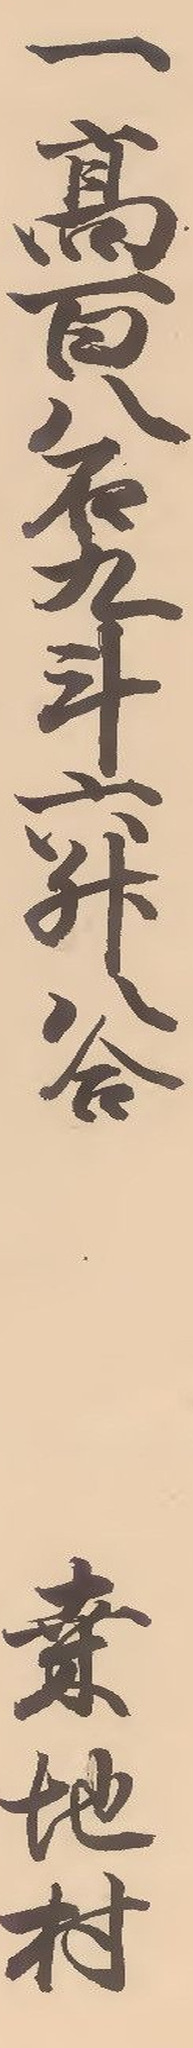一高百八石九斗六升八合桑地村
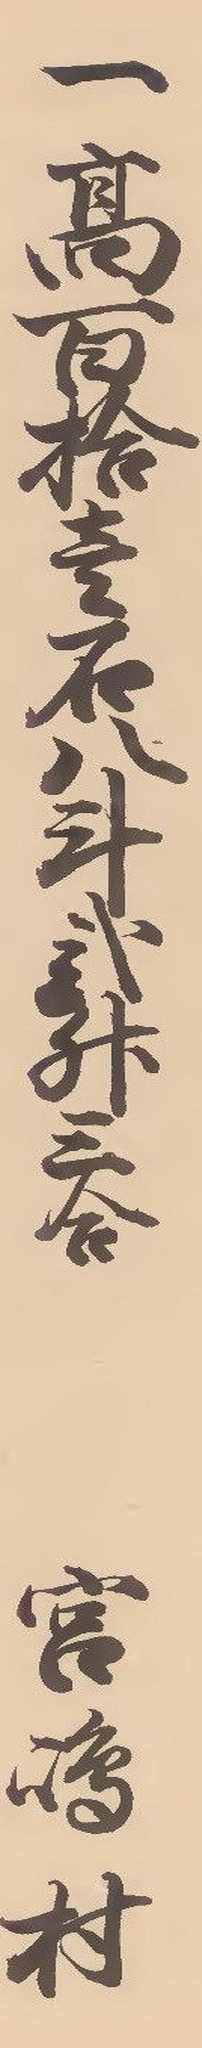一高百拾壱石八斗弐升三合宮島村
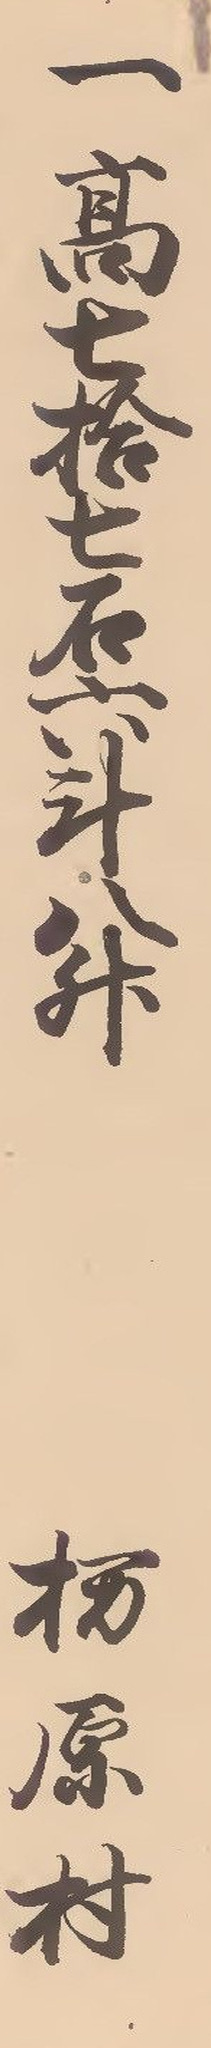一高七拾七石六斗八升栃原村
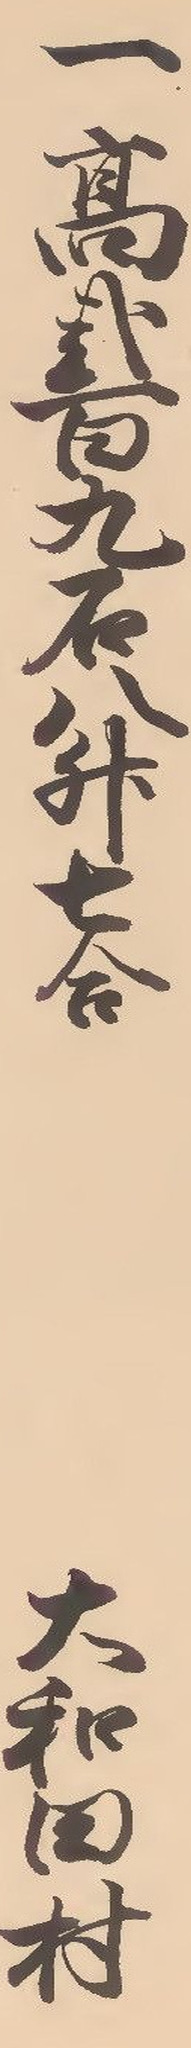一高弐百九石八升七合大和田村
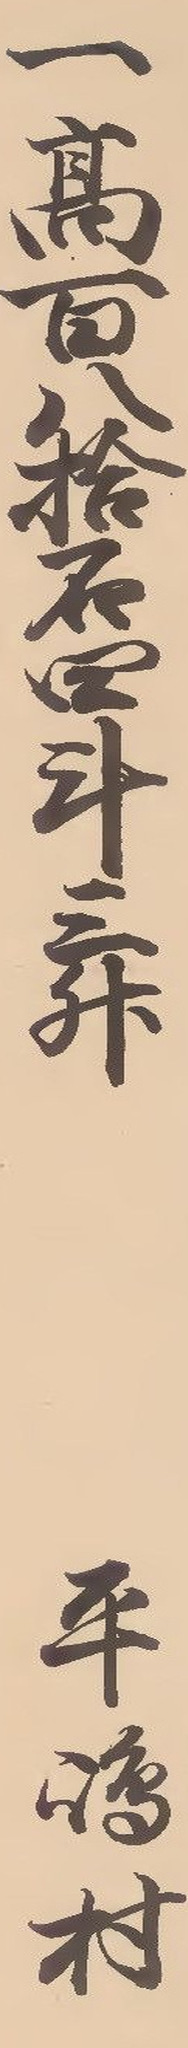一高百八拾石四斗三升平島村
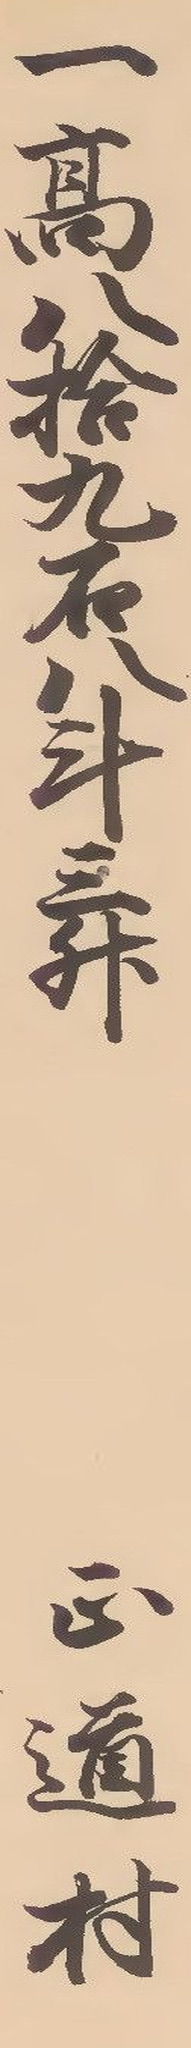一高八拾九石八斗三升正道村
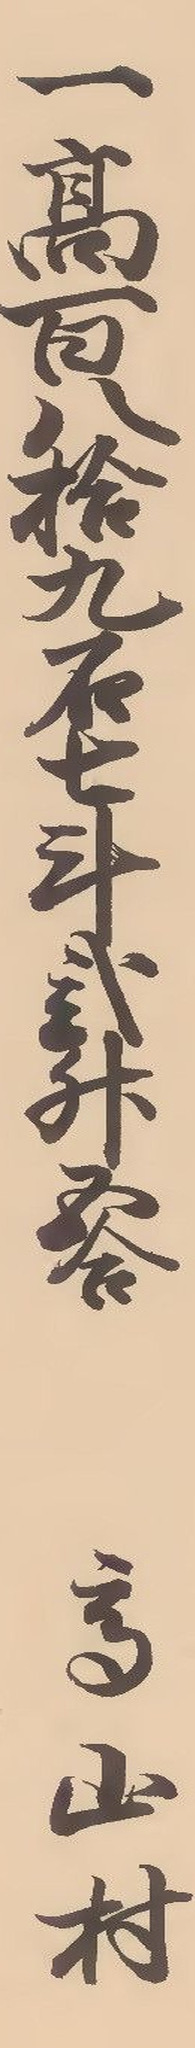一高百八拾九石七斗弐升五合高山村
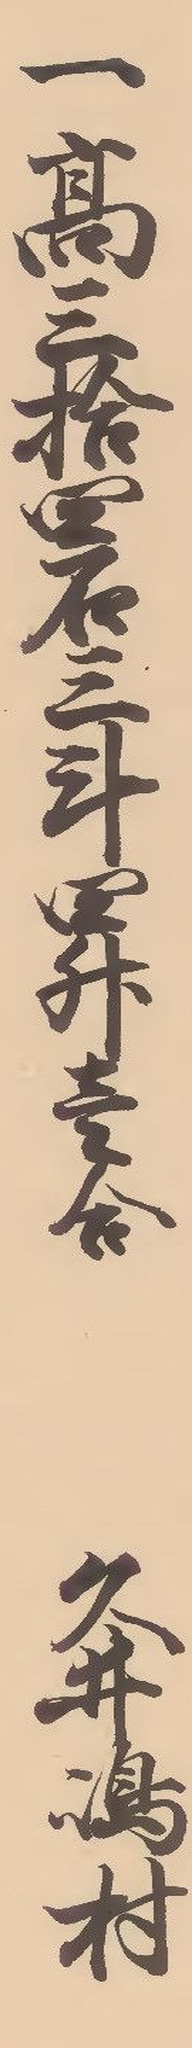一高三拾四石三斗四升壱合久井島村
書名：遠江国郷帳
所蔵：国立公文書館 National Archives of Japan
